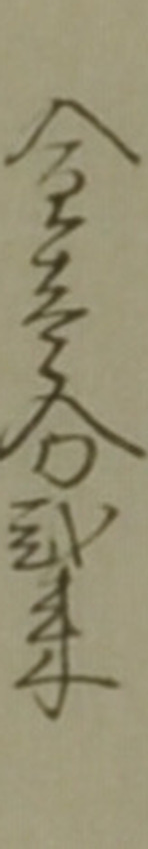金壱分弐朱
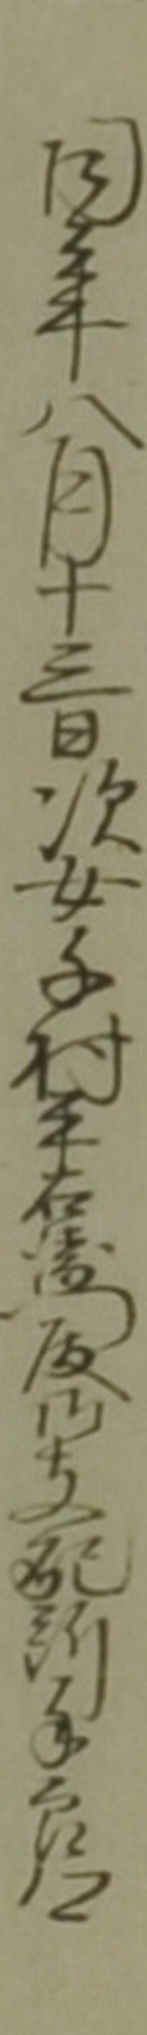一同年八月十三日次女手村平右衛門殿御支配所手良郷

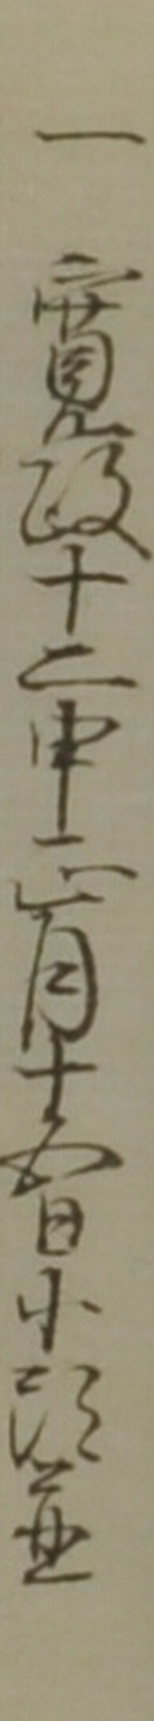一寛政十二申正月十五日小頭並
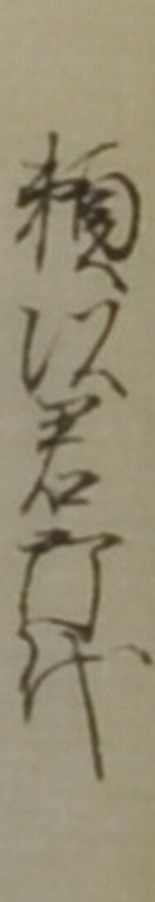頼以君御代
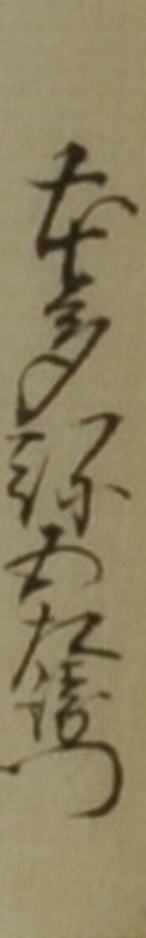本多弥五左衛門
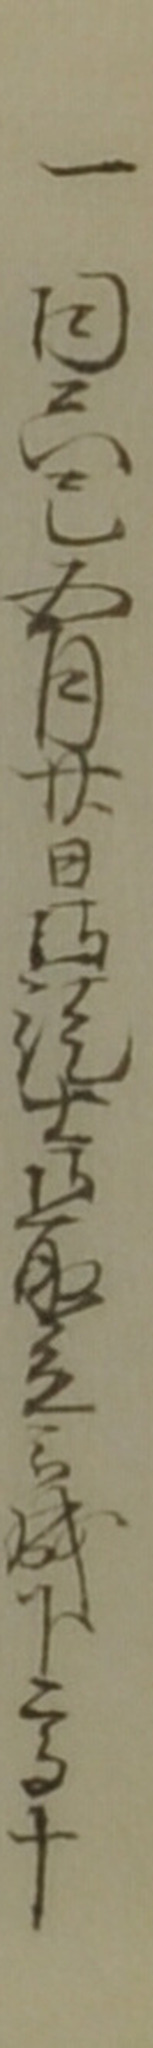一同六巳五月廿日御徒士御取立被成下高十
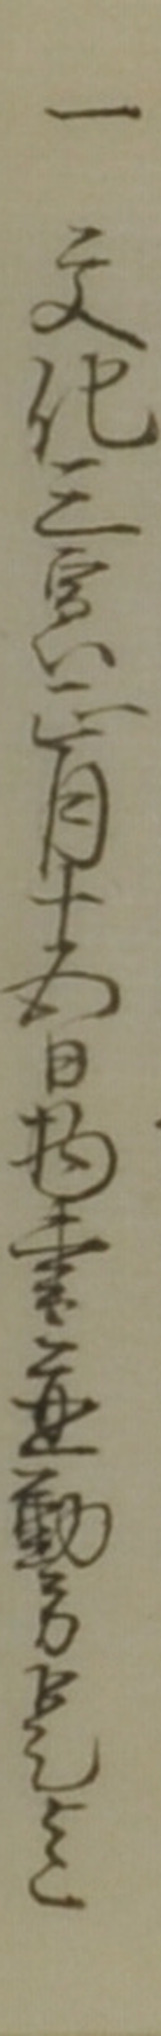一文化三寅正月十五日物書並勤方是迄
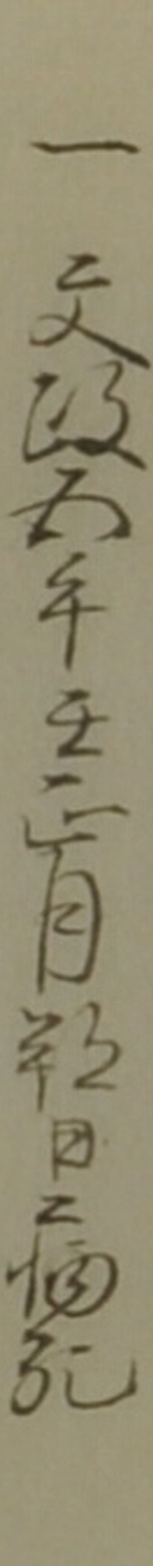一文政五午閏正月朔日病死
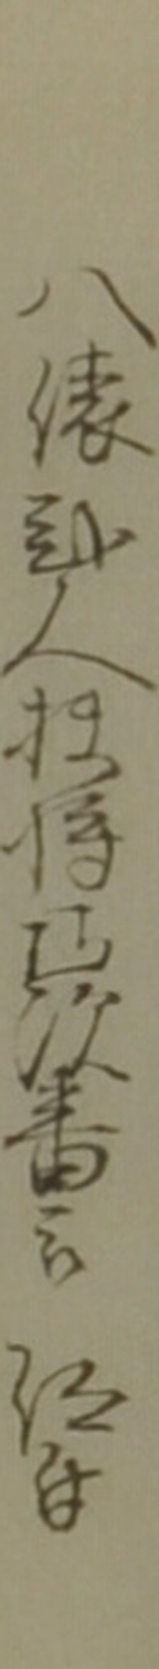八俵弐人扶持御次番被仰付
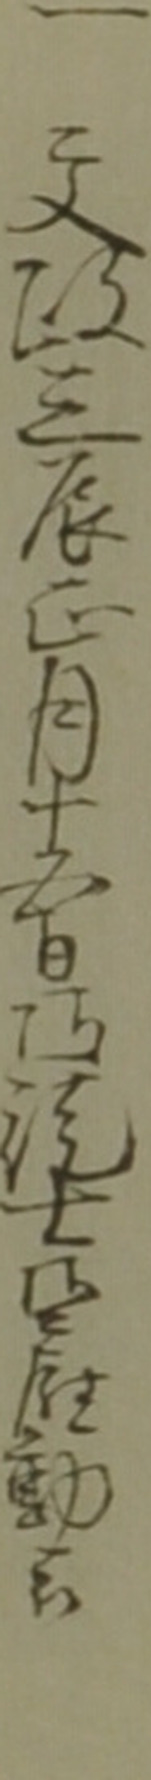一文政三辰正月十五日御徒士御雇勤被
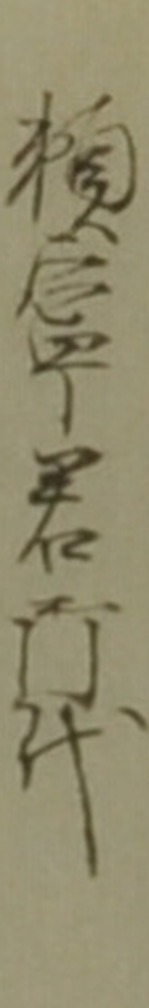頼以君御代
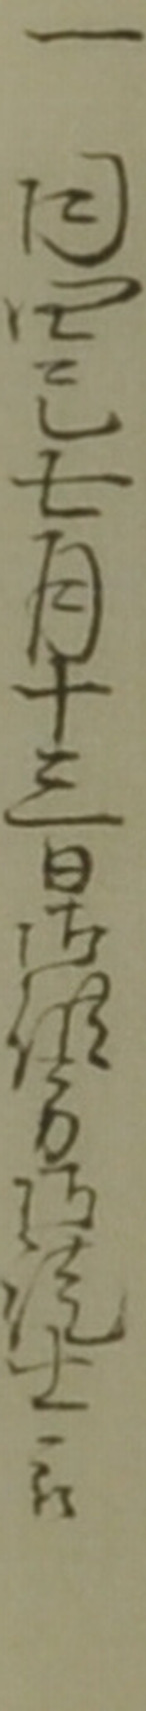一同四巳七月十三日御供方御徒士被
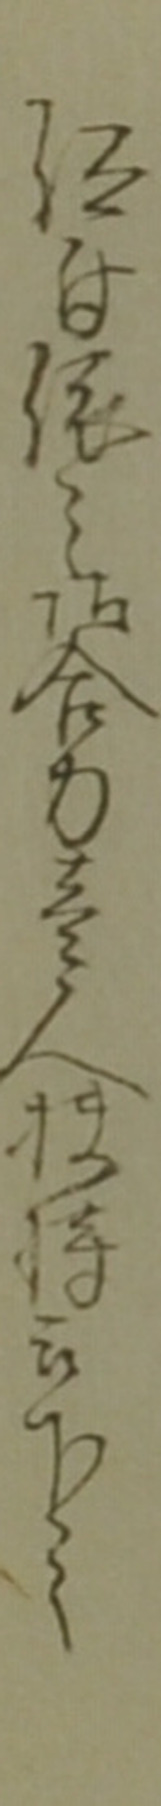仰付依之御合力壱人扶持被下之
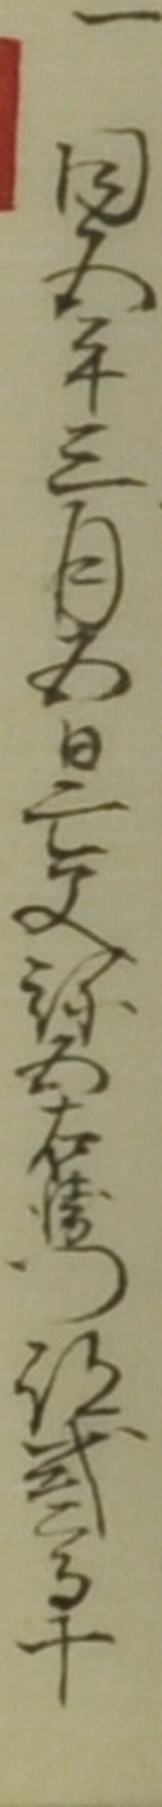一同五午三月五日亡父弥五右衛門跡式高十
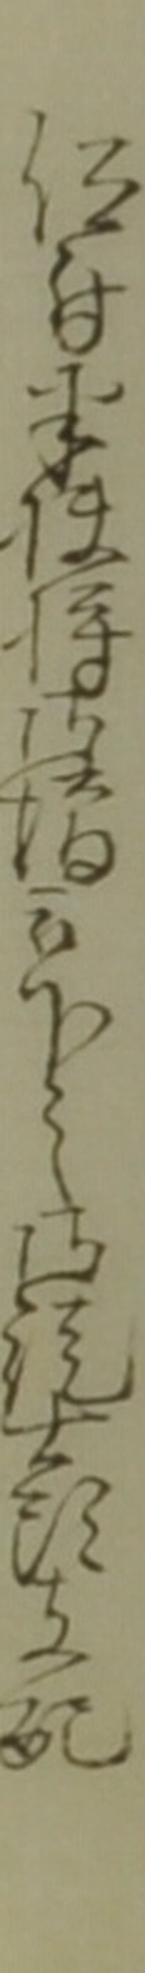仰付半扶持御増被下之御徒士頭支配

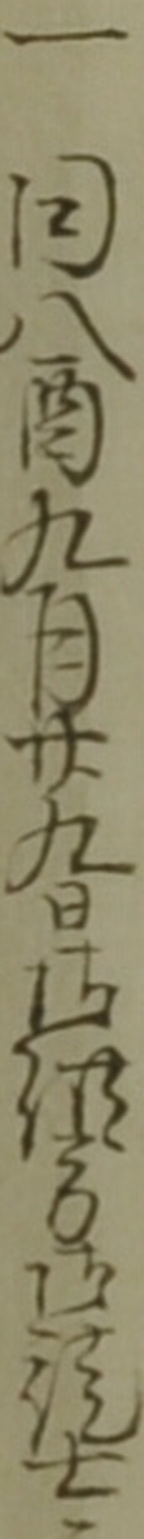一同八酉九月廿九日御供方御徒士被
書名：無足諸士勤仕録（六）
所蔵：伊那市立高遠町図書館・合同会社AMANE
